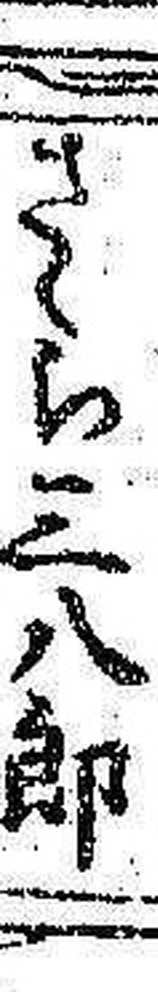さゝら三八郎
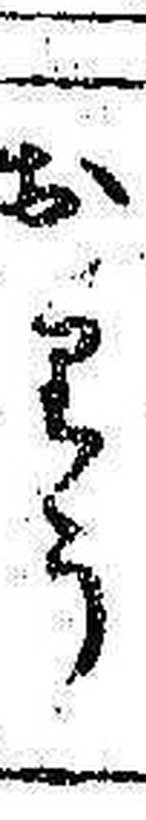おりう

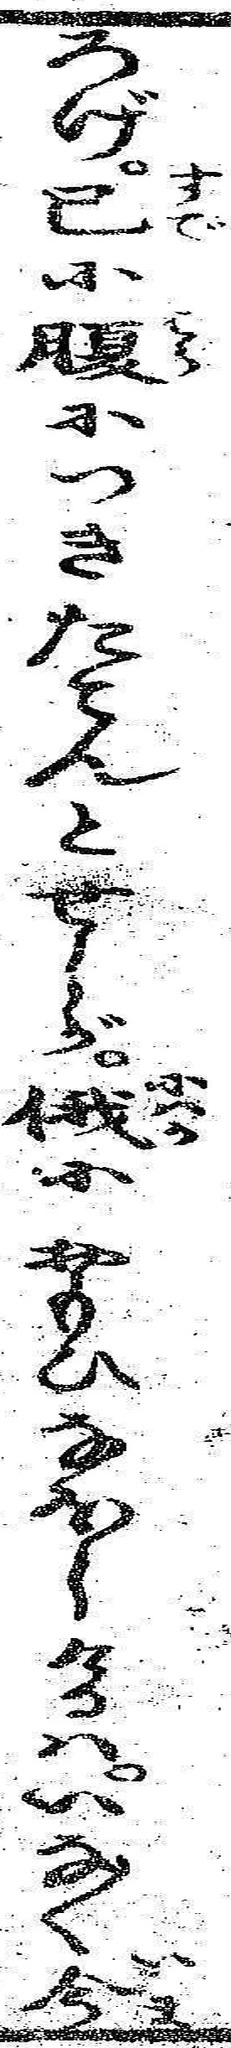ろげ。已に腹につきたてんとせしが。俄におもひなほしけるは。いな〳〵今
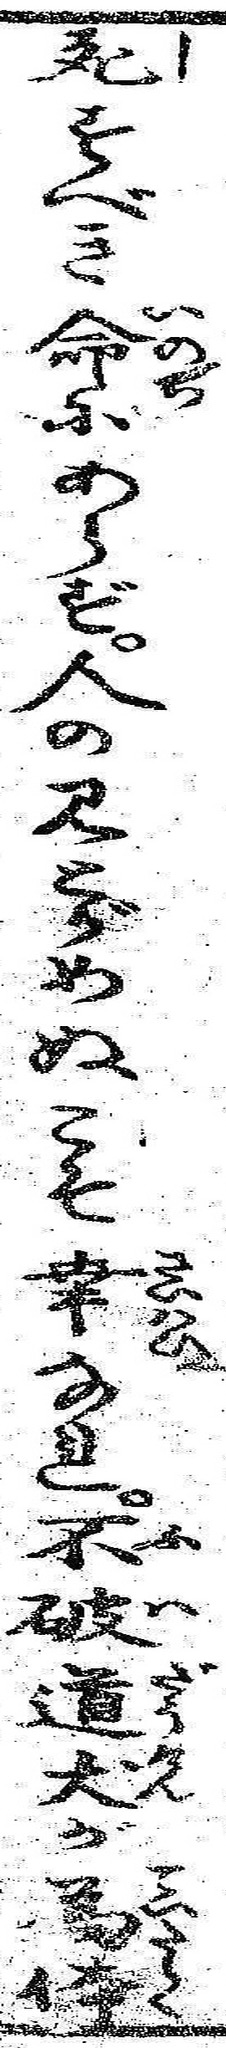死すべき命にあらず。人の見とがめぬこそ幸なれ。不破道犬が為体
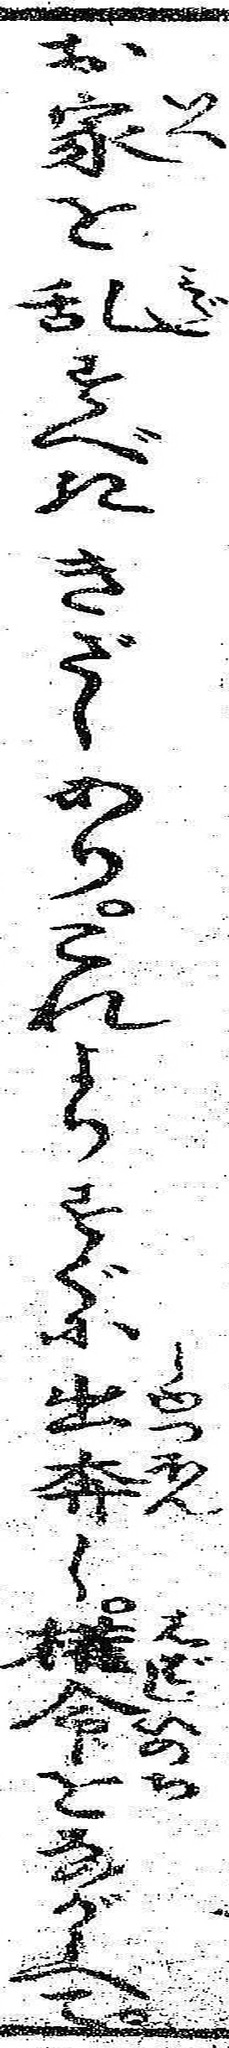お家を乱すべききざしあり。これよりすぐに出奔し。権命をながらへて。
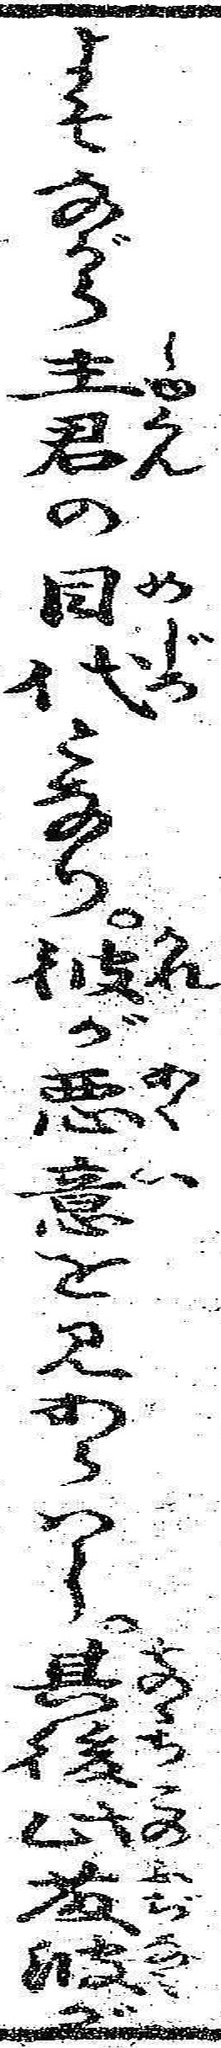よそながら主君の目代となり。彼が悪意を見あらはし。其後此藤波が
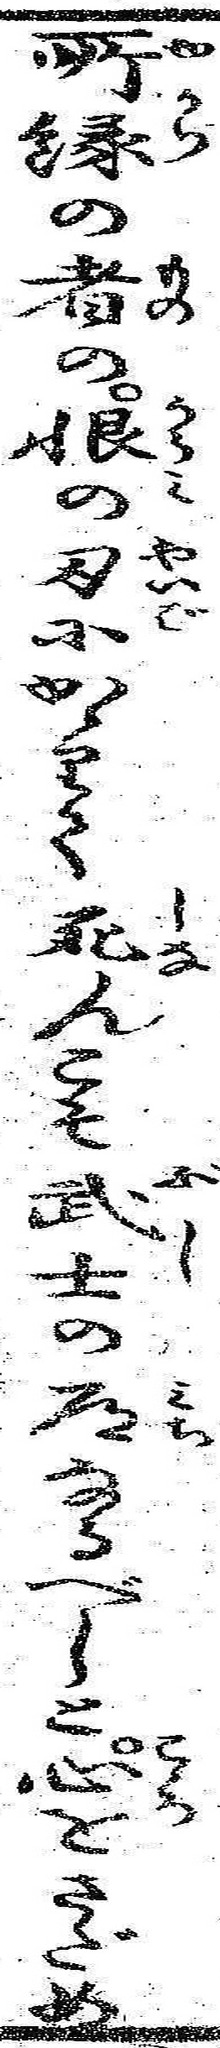所縁の者の。恨の刃にかゝりて死んこそ武士の道なるべしと。心をさだめ
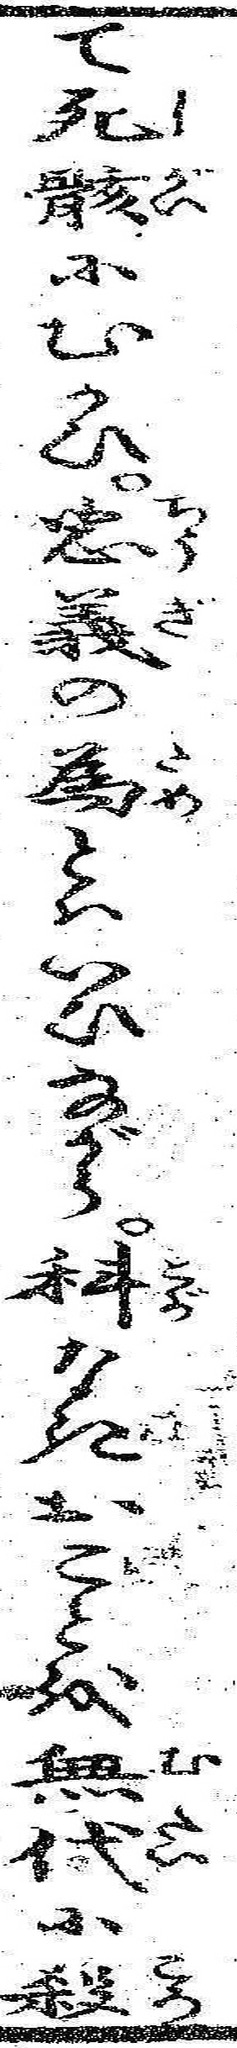て死骸にむかひ。忠義の為とはいひながら。科なきおことを無代に殺
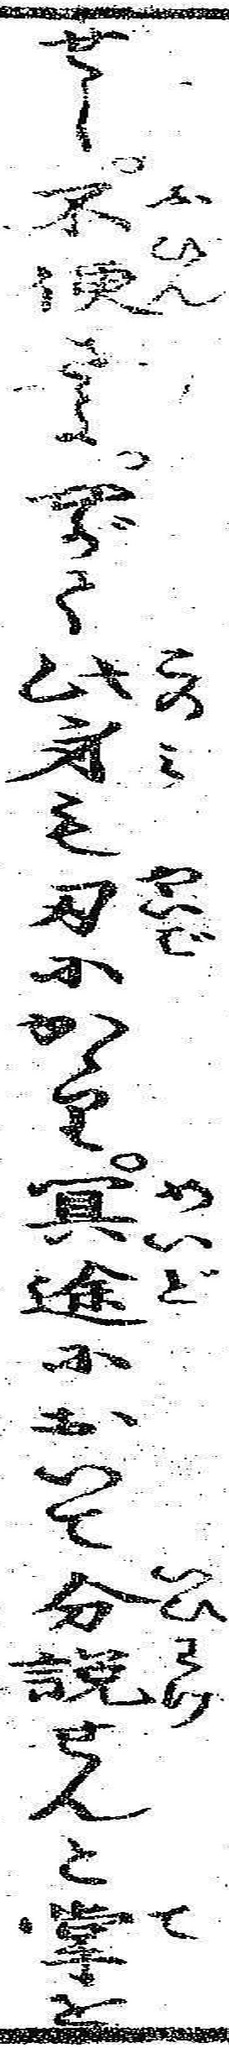せし。不便さよ。やがて此身も刃にかゝり。冥途において分説せんと掌を
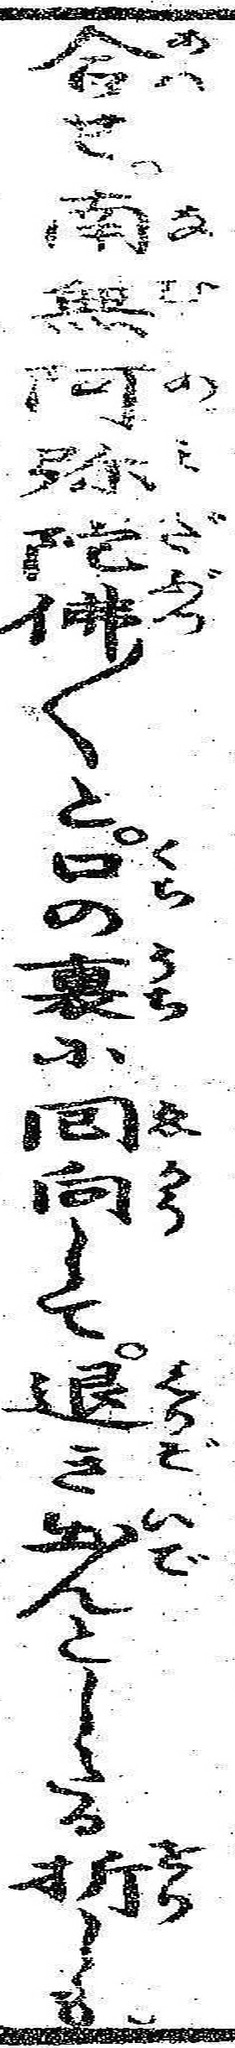合せ。南無阿弥陀仏〳〵と。口の裏に回向して。退き出んとしたる折しも。
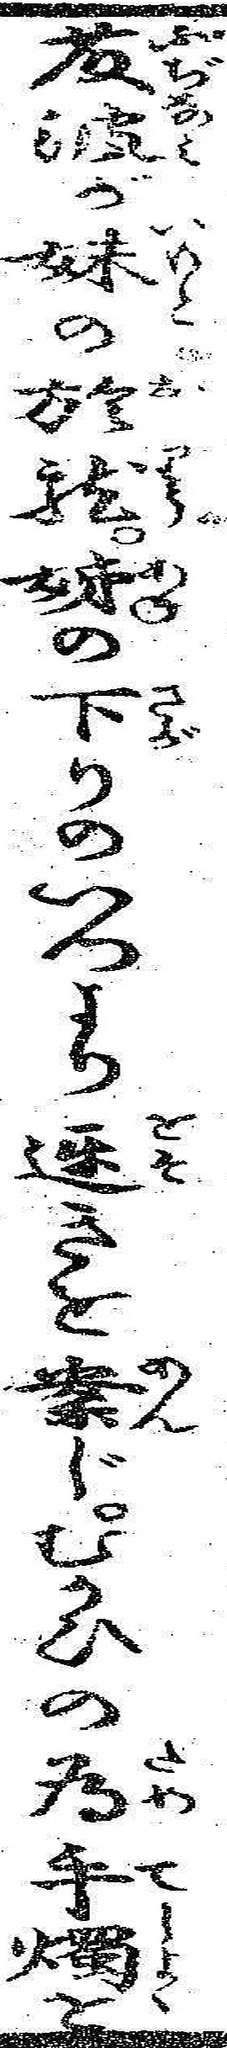藤波が妹の於竜。姉の下りのいつより遅きを案じ。むかひの為手燭を
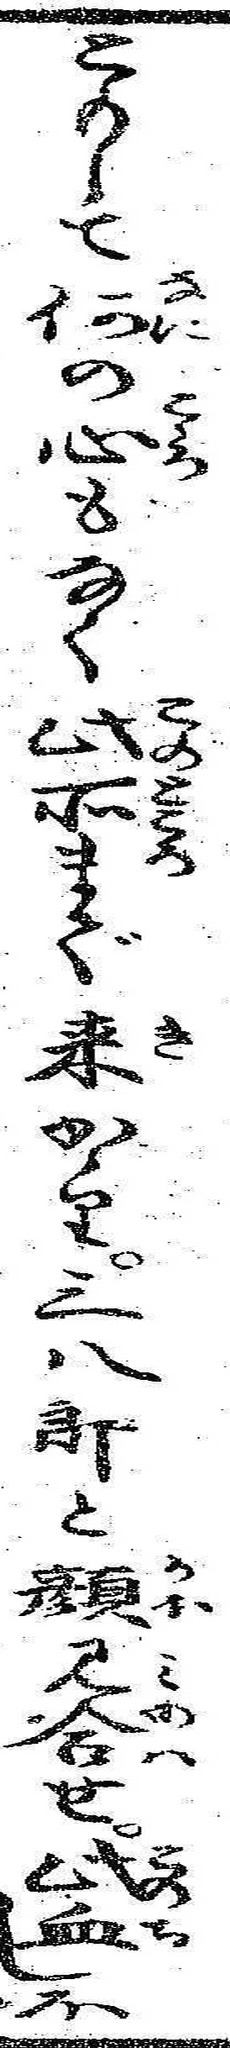ともして何の心もなく此所まで来かゝり。三八郎と顔見合せ。此血しほ
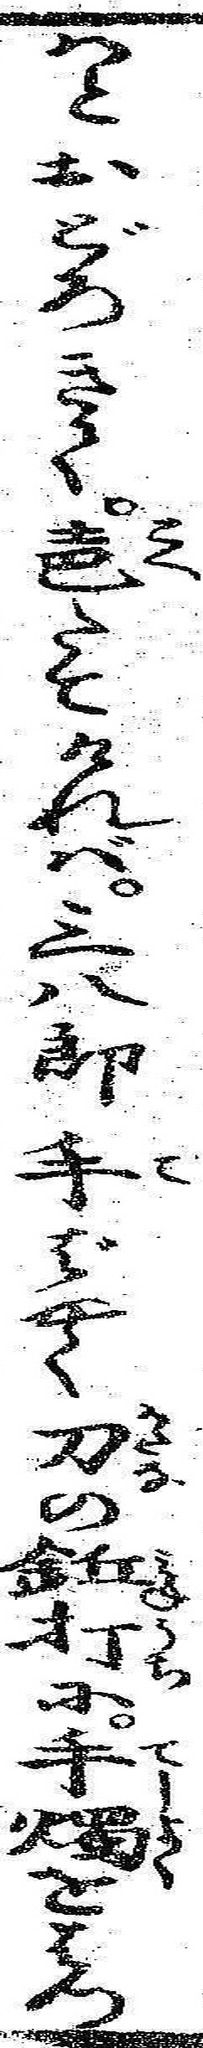はとおどろきて。声たてければ。三八郎手ばやく刀の打に。手燭をはつ
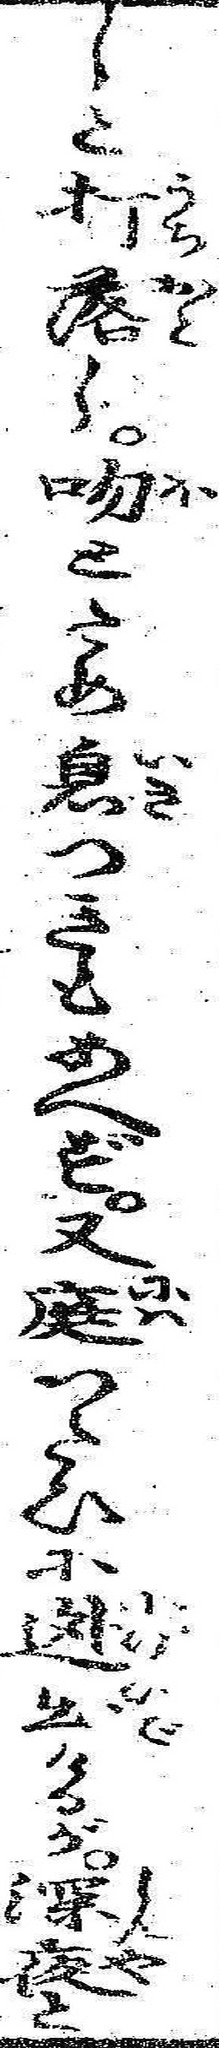しと打落し。吻とため息つきもあへず。又庭つたひに逃出けるが。深夜と
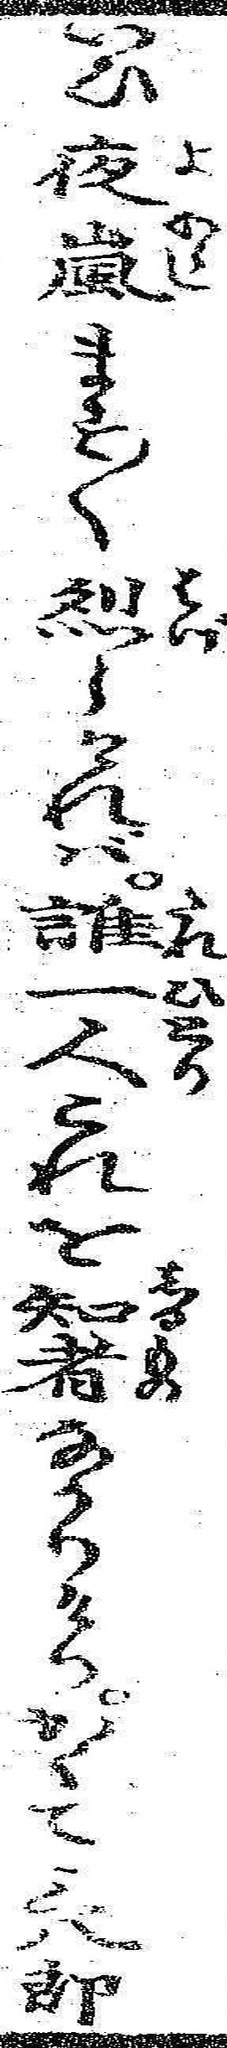いひ夜嵐ます〳〵烈しければ。誰一人これを知者なかりけり。かくて三八郎
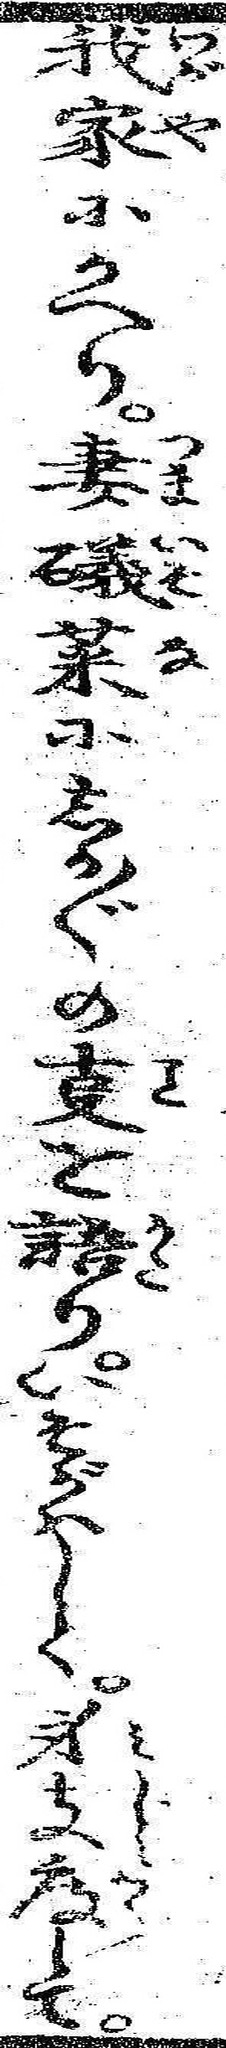我家にかへり。妻礒菜にしか〴〵の事を語り。いそがはしく。身支度して。
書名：昔話稲妻表紙
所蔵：国文学研究資料館
